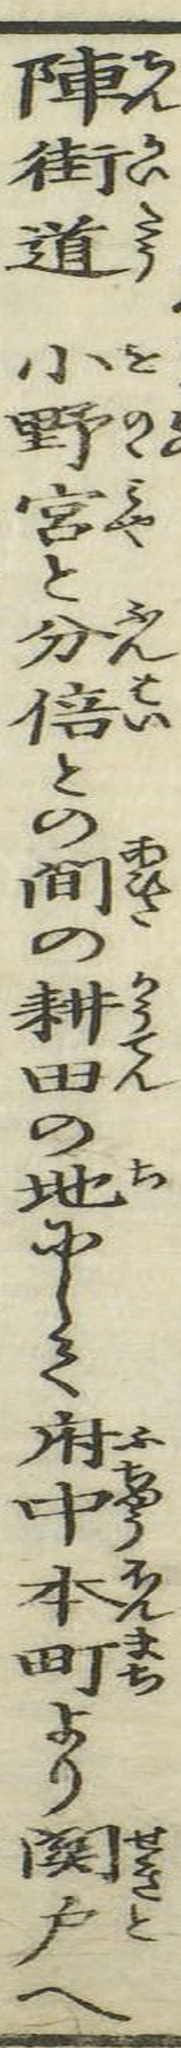陣街道小野宮と分倍との間の耕田の地にして府中本町より関戸へ
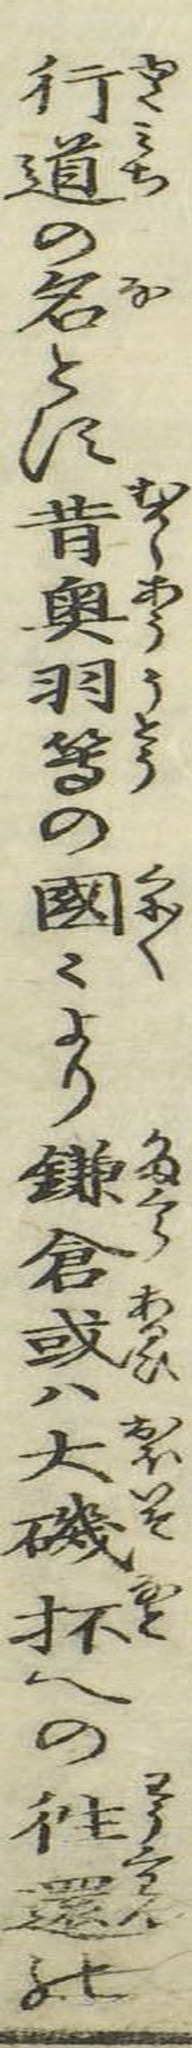行道の名とす昔奥羽等の国々より鎌倉或は大磯抔への往還の
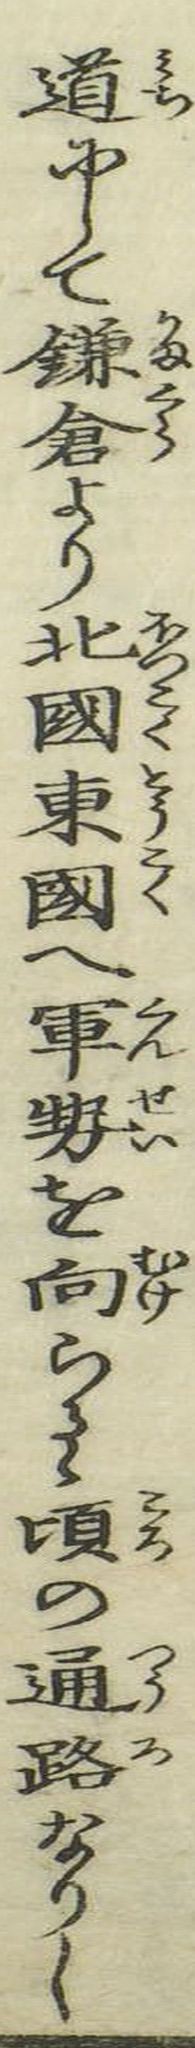道にして鎌倉より北国東国へ軍勢を向らるゝ頃の通路なりし

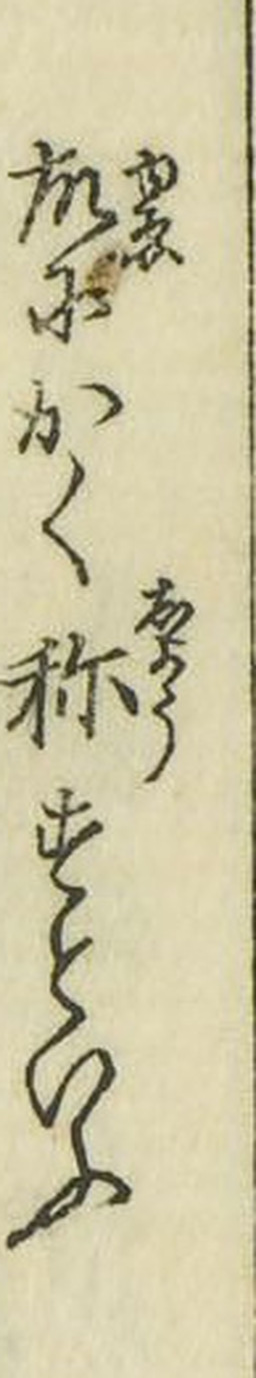故にかく称すといふ
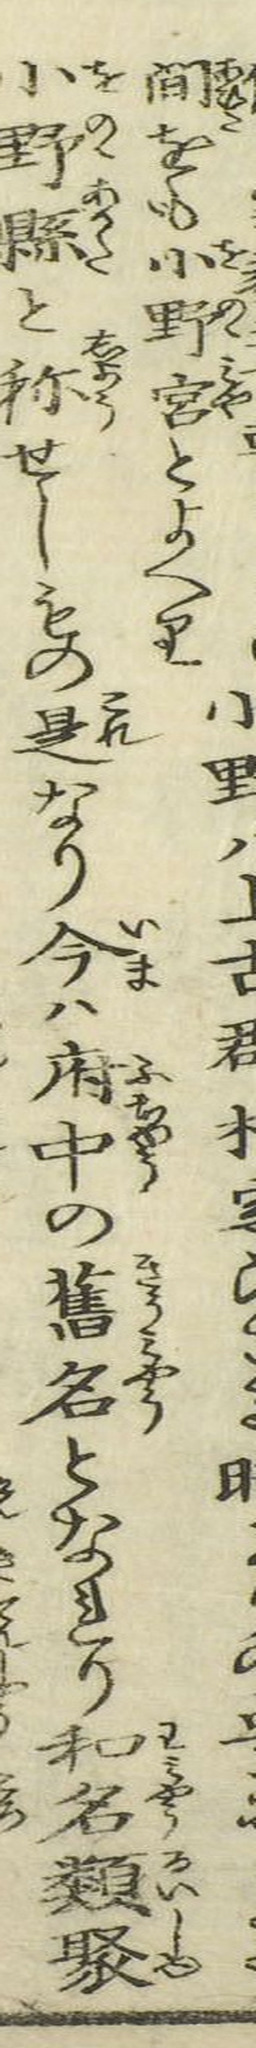小野県と称せしもの是なり今は府中の舊名となれり和名類聚
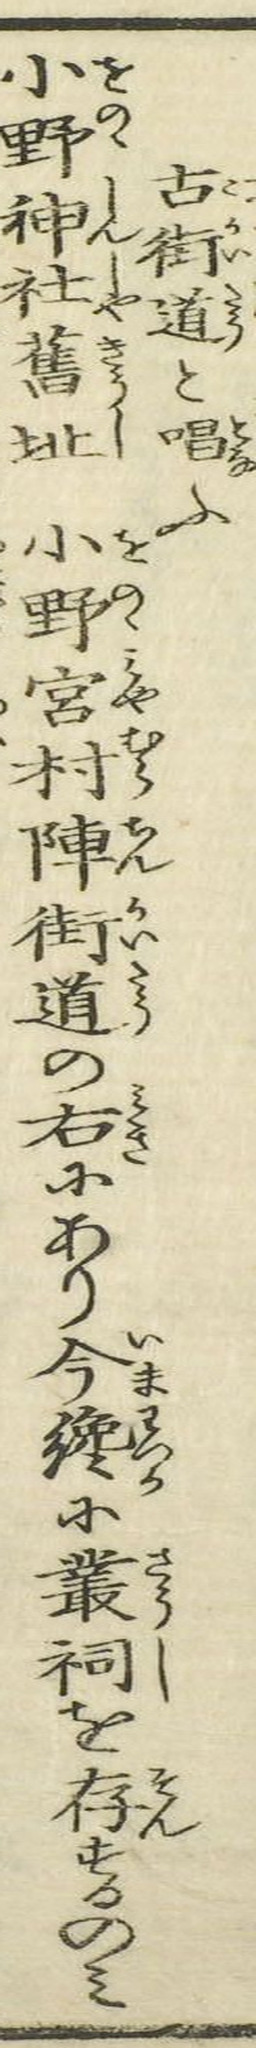小野神社舊址小野宮村陣街道の右にあり今纔に叢祠を存するのみ
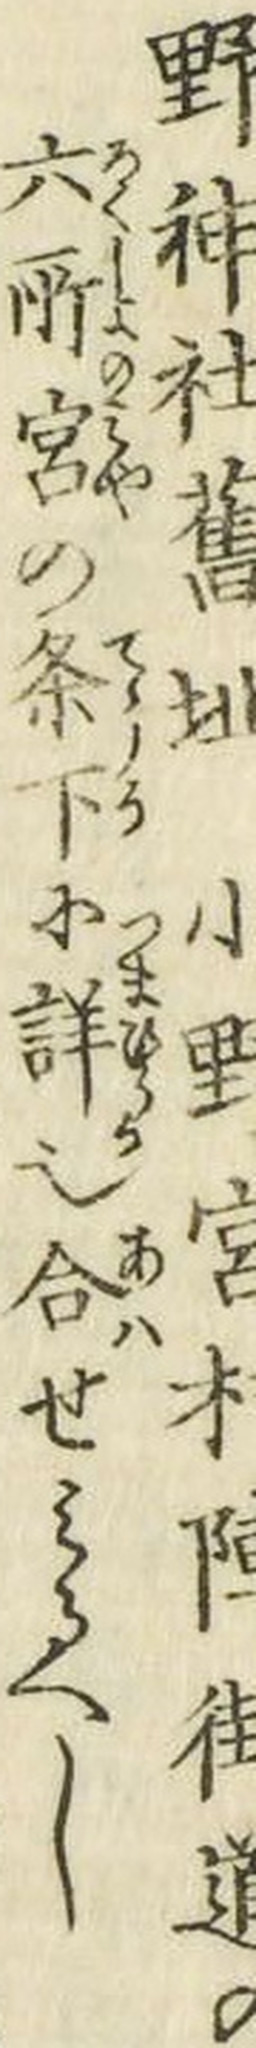六所宮の条下に詳也合せみるへし
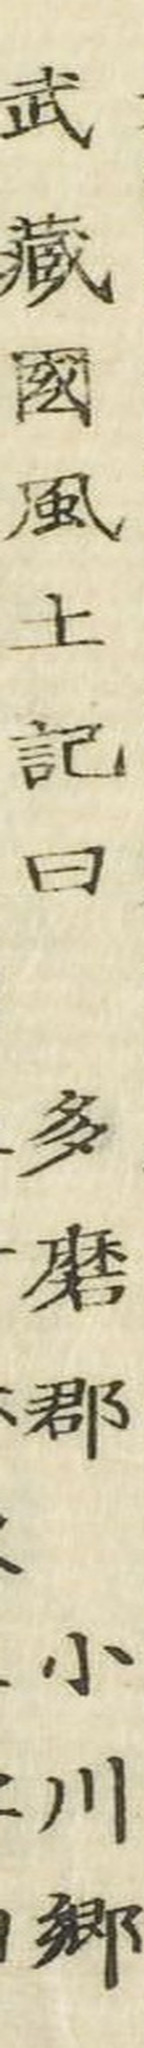武蔵国風土記曰多磨郡小川郷
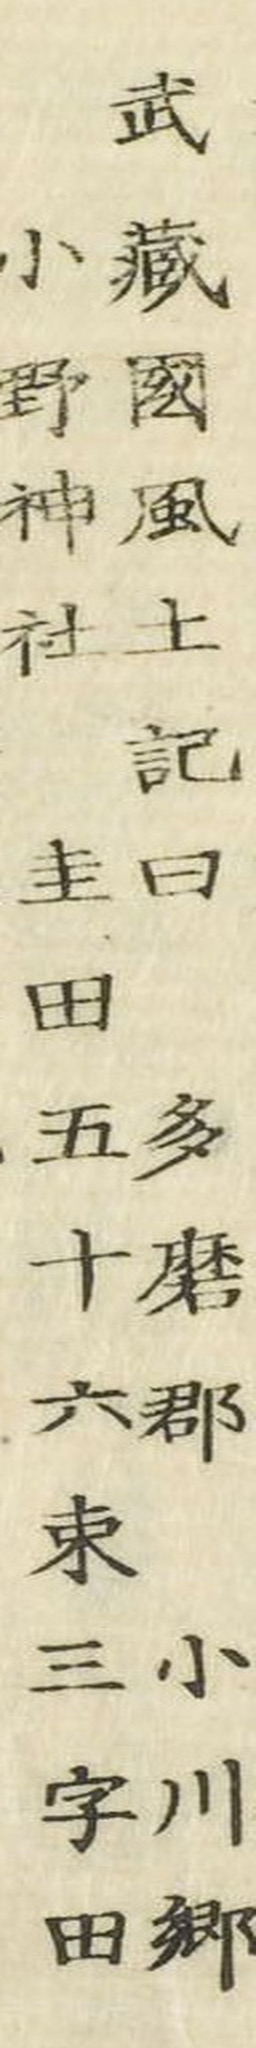小野神社圭田五十六束三字田
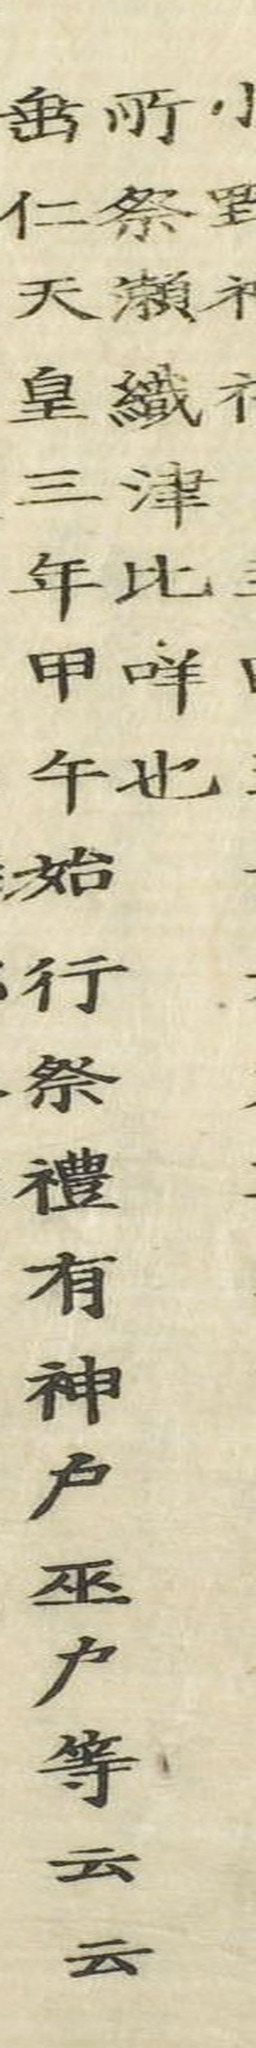垂仁天皇三年甲午始行祭礼有神戸巫戸等云云
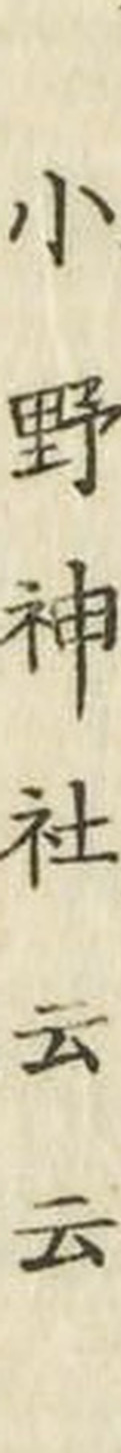小野神社云云
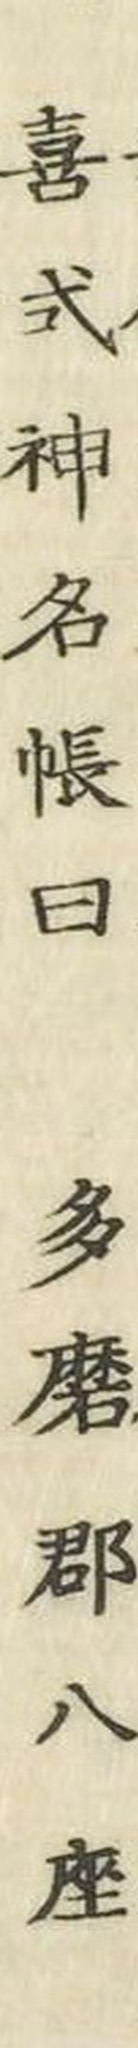延喜式神名帳曰多磨郡八座
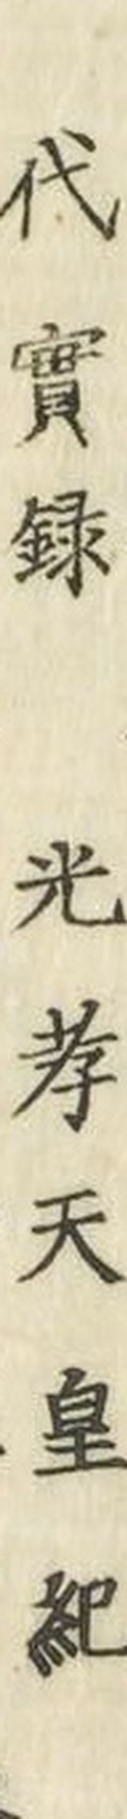三代実録光孝天皇紀
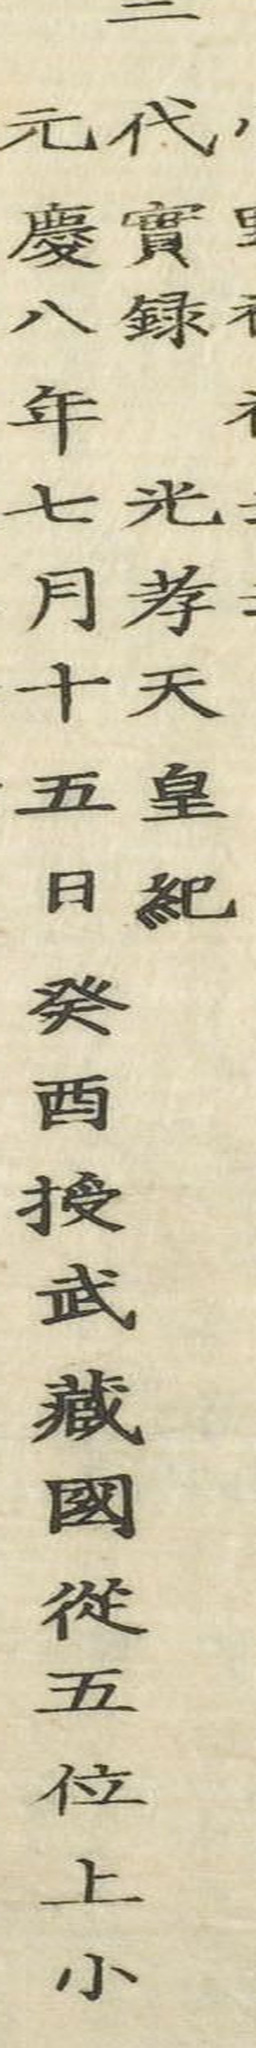元慶八年七月十五日葵酉授武蔵国従五位上小
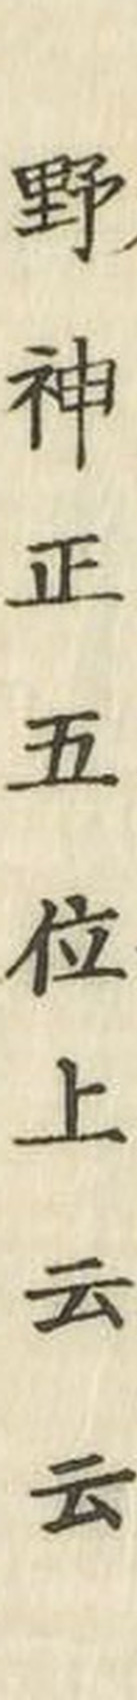野神正五位上云云
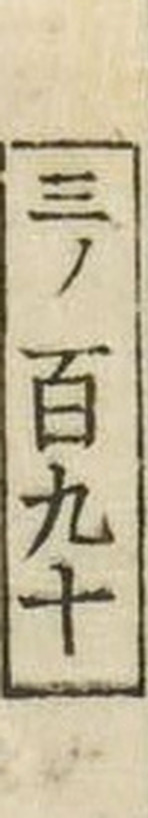三ノ百九十
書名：江戸名所図会 20巻 巻之10
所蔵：東京学芸大学教育コンテンツアーカイブ
